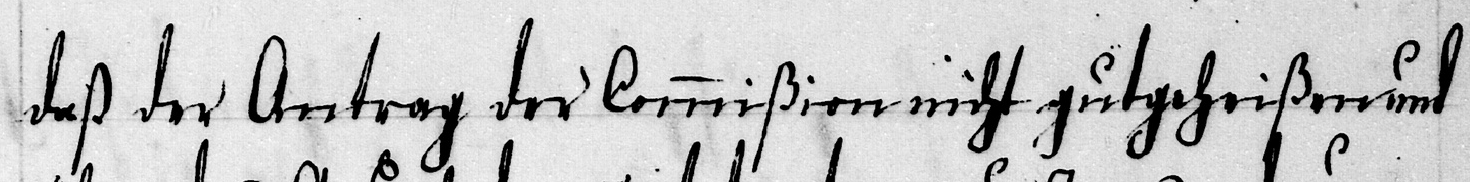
daß der Antrag der Commißion nicht gutgeheißen und
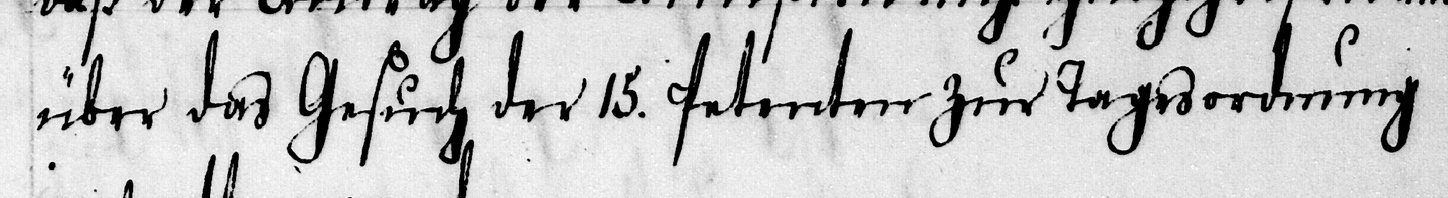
über das Gesuch der 15. Petenten zur Tagesordnung
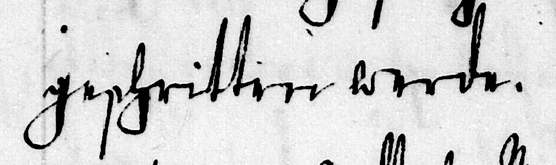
geschritten werde.
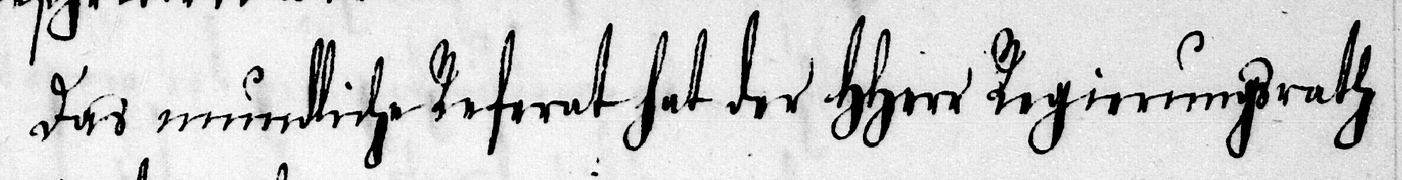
Das mundliche Referat hat der HHerr Regierungsrath
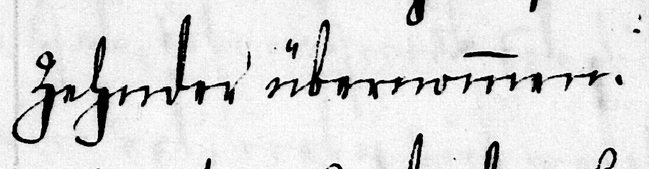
Zehnder übernommen.
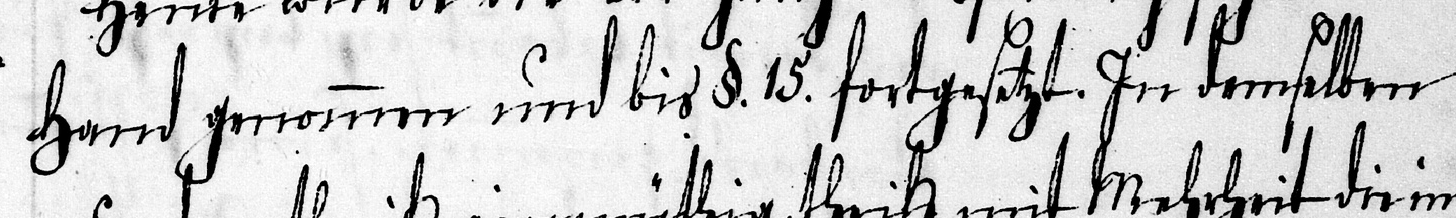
Hand genommen und bis §. 15. fortgesetzt. In demselben
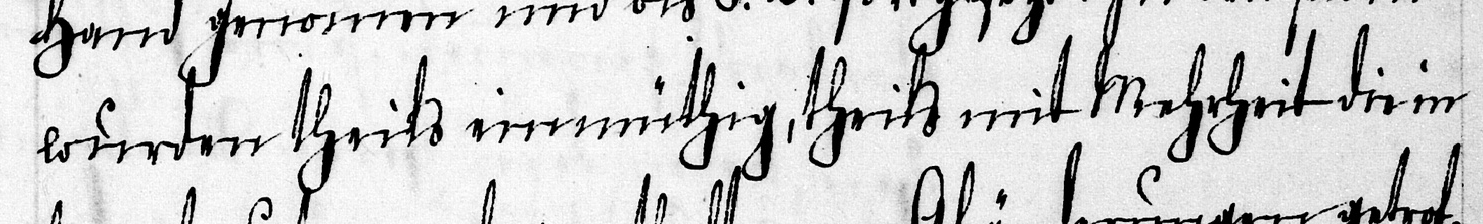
wurden theils einmüthig, theils mit Mehrheit die in
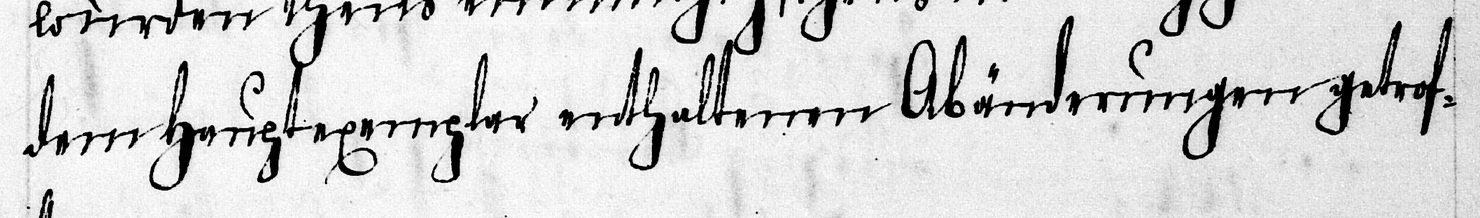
dem Hauptexemplar enthaltenen Abänderungen getrof¬
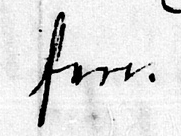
fen.
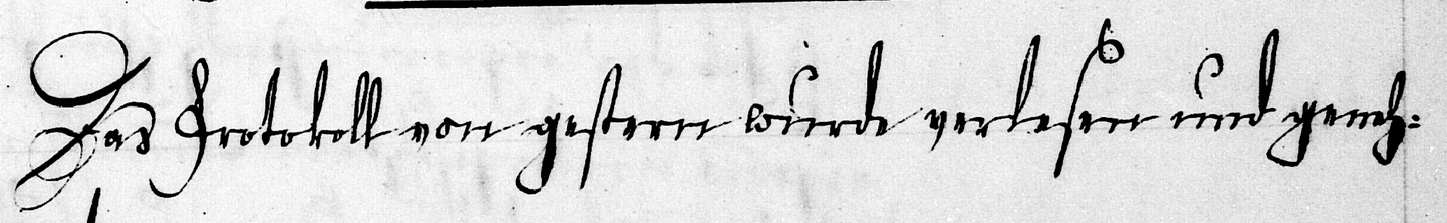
Das Protokoll von gestern wurde verlesen und geneh¬
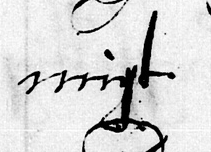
migt.
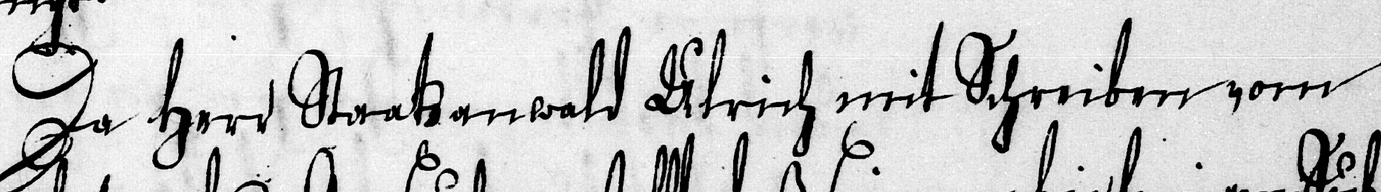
Da Herr Staatsanwald Ulrich mit Schreiben vom
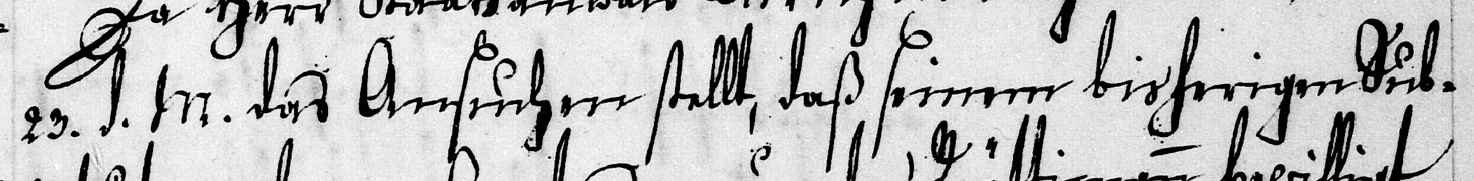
23. d. M. das Ansuchen stellt, daß seinem bisherigen Subs¬
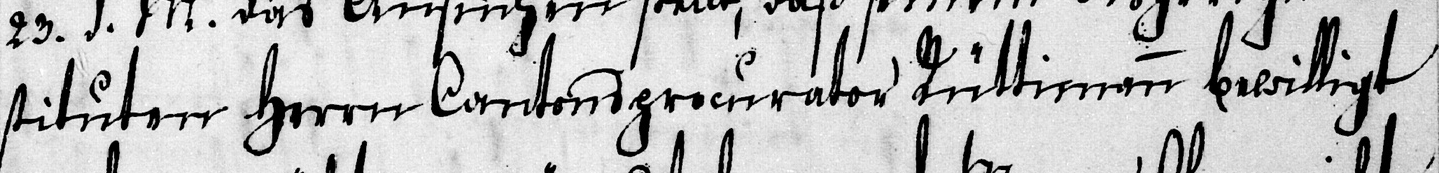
tituten Herrn Cantonsprocurator Rüttimann bewilligt
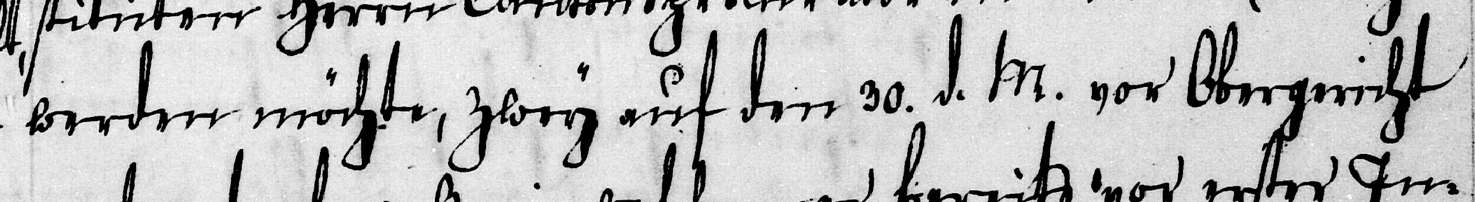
werden möchte, zwey auf den 30. d. M. vor Obergericht
